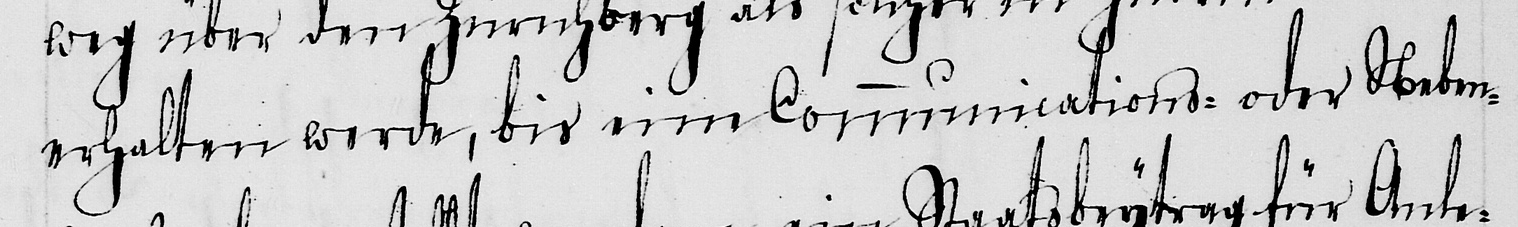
erhalten werde, bis eine Communications- oder Neben¬
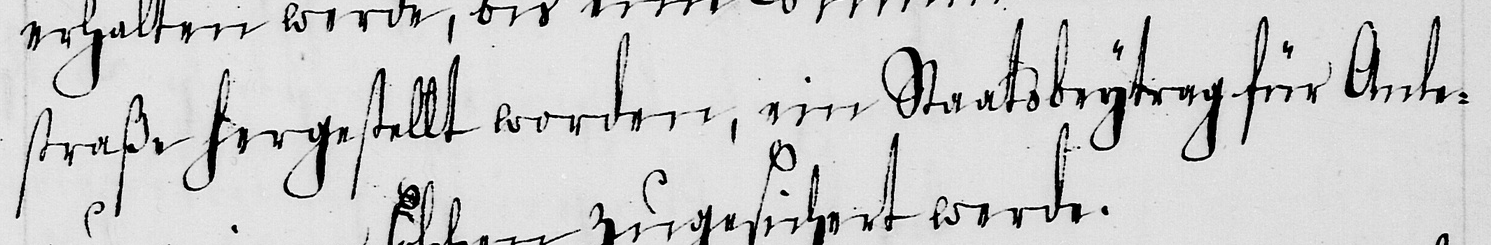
straße hergestellt werden, ein Staatsbeytrag für Anle¬
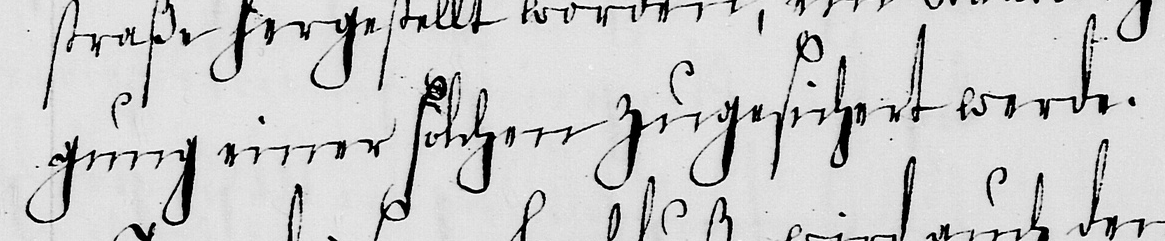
gung einer solchen zugesichert werde.
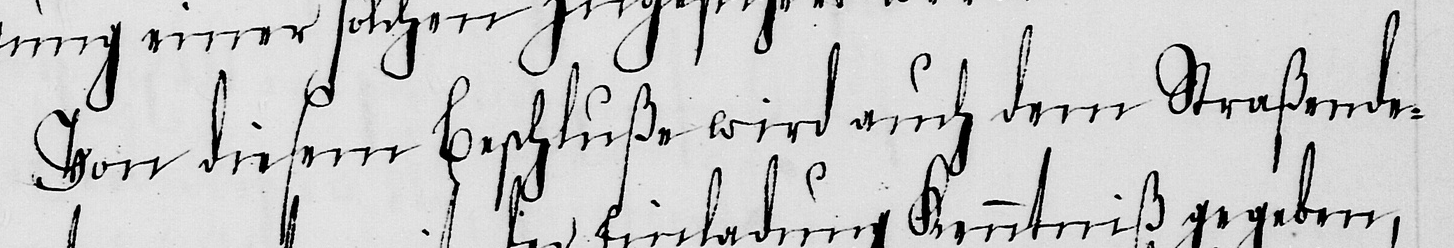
Von diesem Beschluße wird auch dem Straßende¬
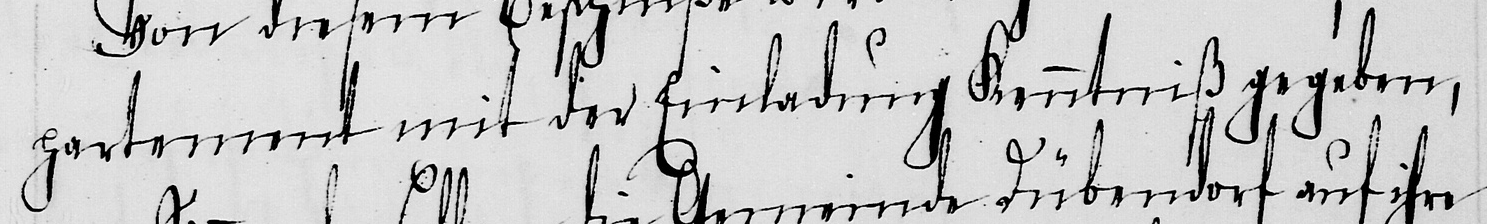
partement mit der Einladung Kenntniß gegeben,
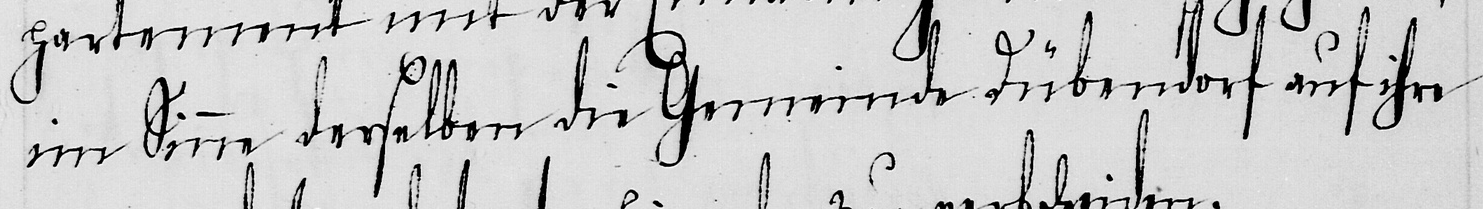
im Sinne derselben die Gemeinde Dübendorf auf ihre
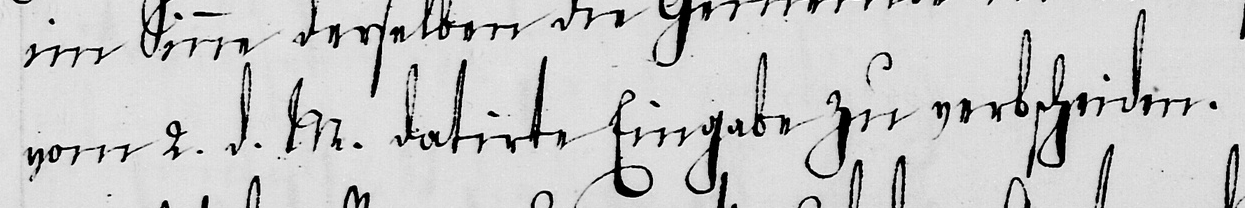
vom 2. d. M. datirte Eingabe zu verbscheiden.
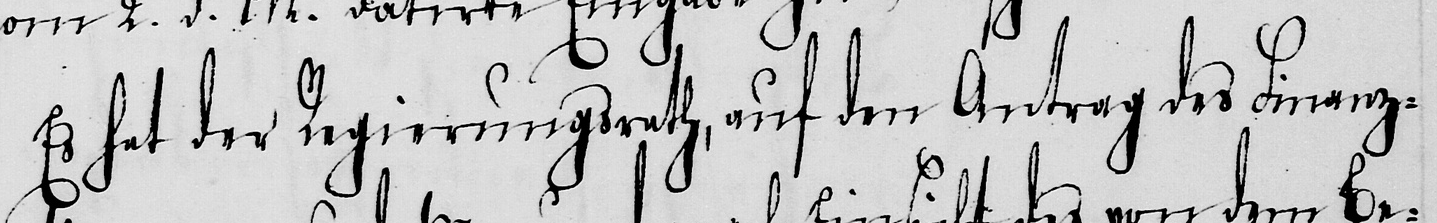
Es hat der Regierungsrath, auf den Antrag des Finanz¬
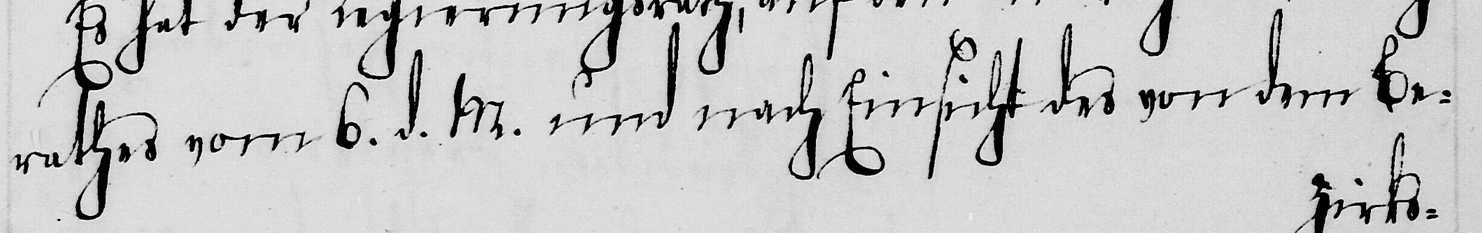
rathes vom 6. d. M. und nach Einsicht des von dem Be-
